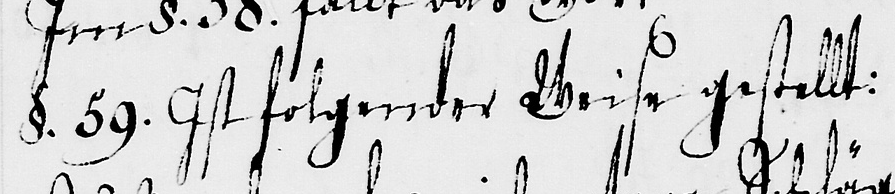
§. 59. ist folgender Weise gestell¬
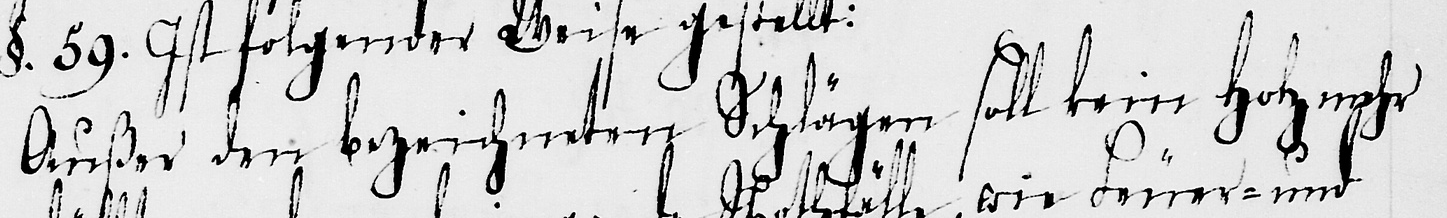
Außer den bezeichneten Schlägen soll kein Holz mehr
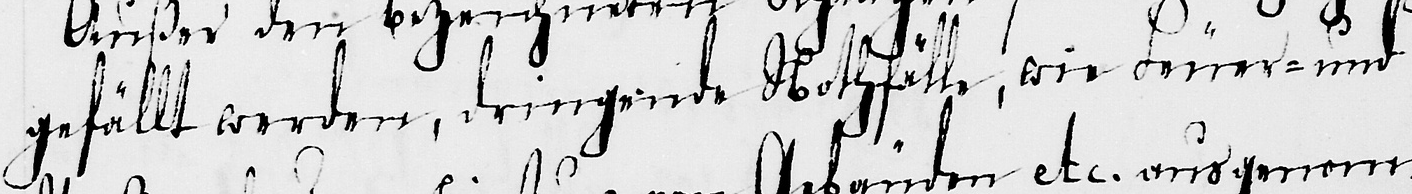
gefällt werden, dringende Nothfälle, wie Feuer- und
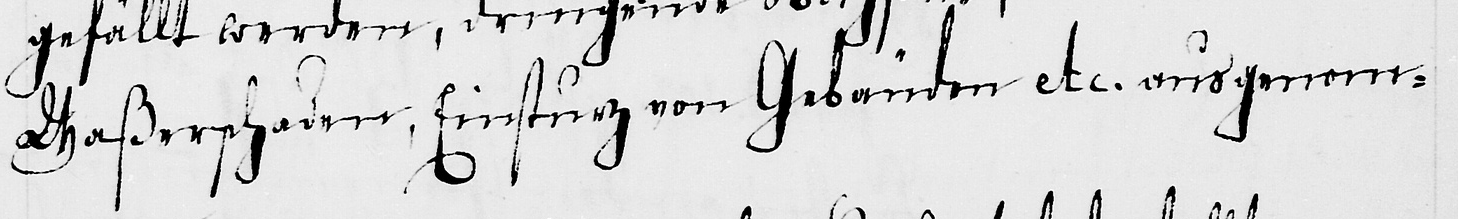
Waßerschaden, Einsturz von Gebäuden etc. ausgenomm¬
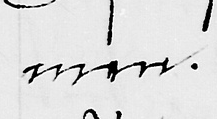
en.
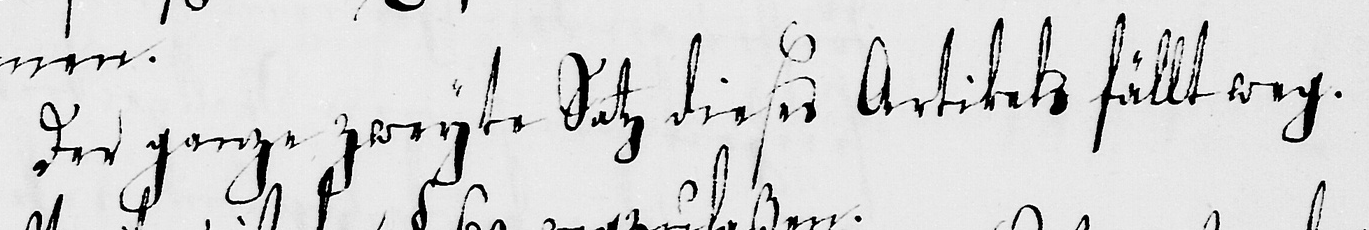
Der ganze zweyte Satz dieses Artikels fällt weg.
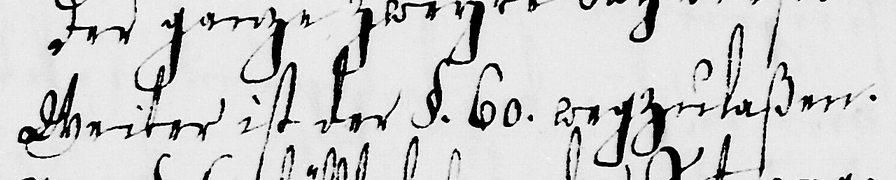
Weiter ist der §. 60. wegzulaßen.
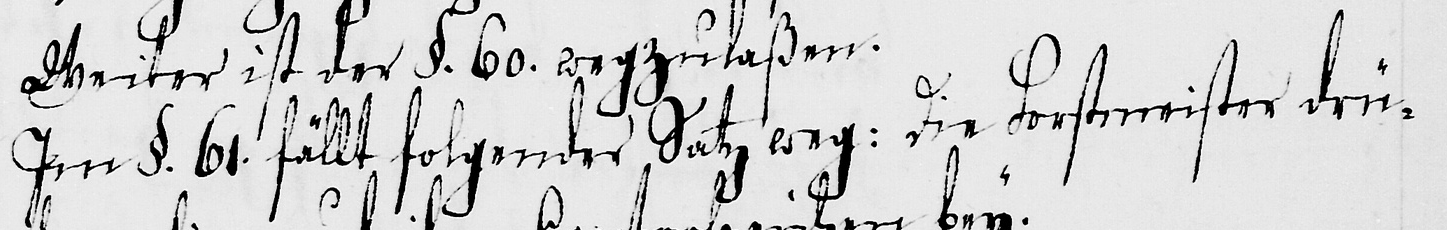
Im §. 61. fällt folgender Satz weg: Die Forstmeister drü¬
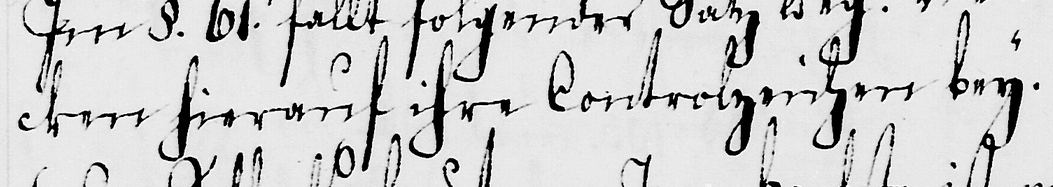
cken hierauf ihre Controlzeichen bey.
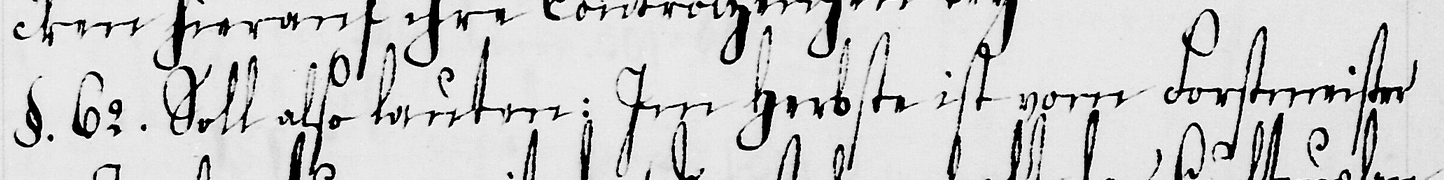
§. 62. Soll also lauten: Im Herbste ist vom Forstmeister
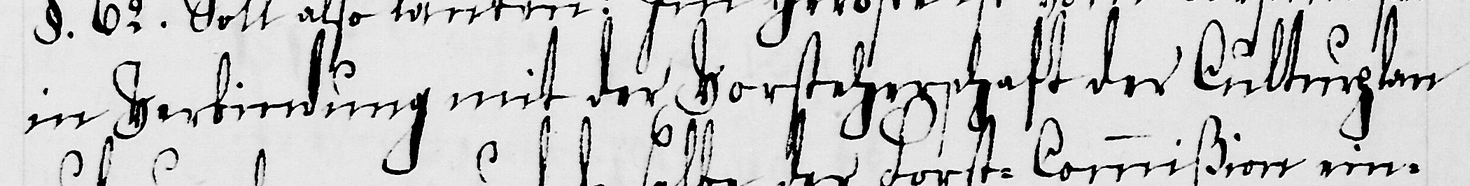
in Verbindung mit der Vorsteherschaft der Culturplan
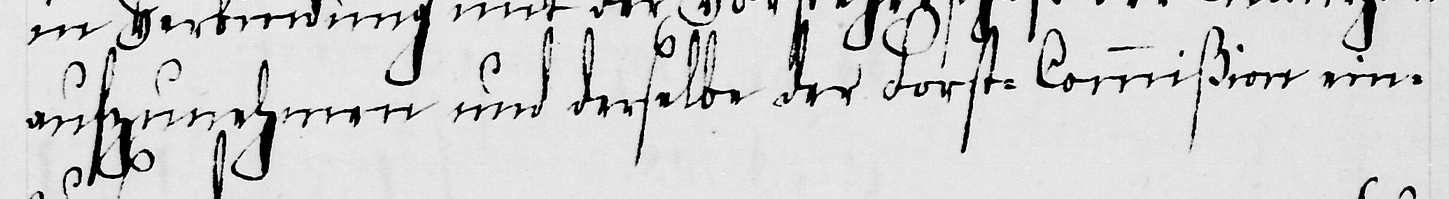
aufzunehmen und derselbe der Forst-Commißion ein¬
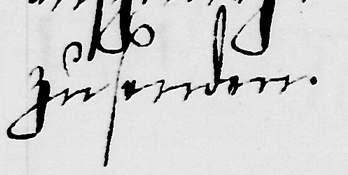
zusenden.
